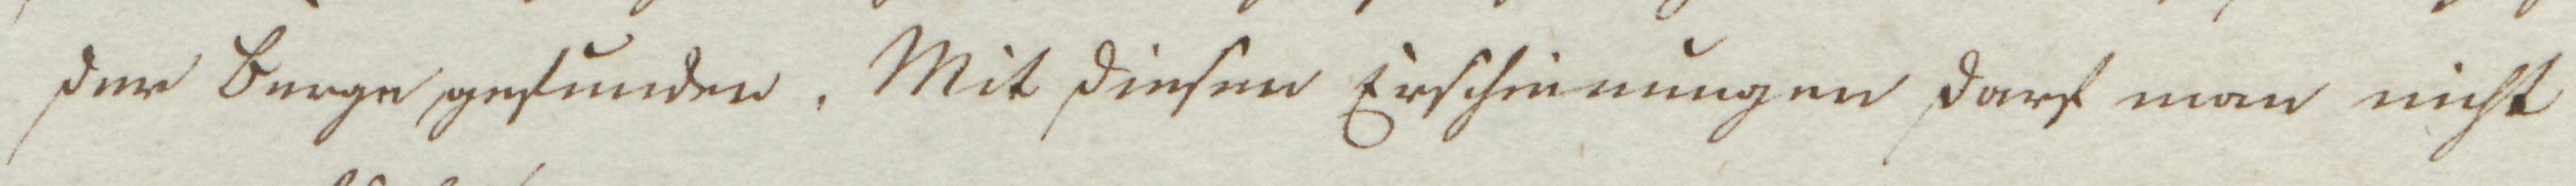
der Berge gefunden. Mit diesen Erscheinungen darf man nicht
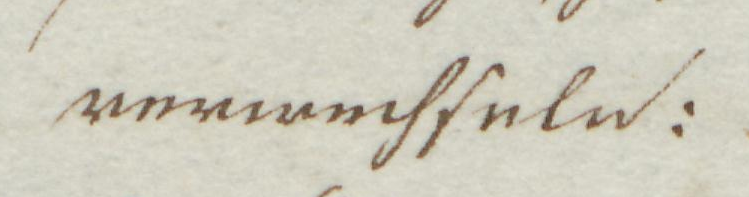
verwechseln:
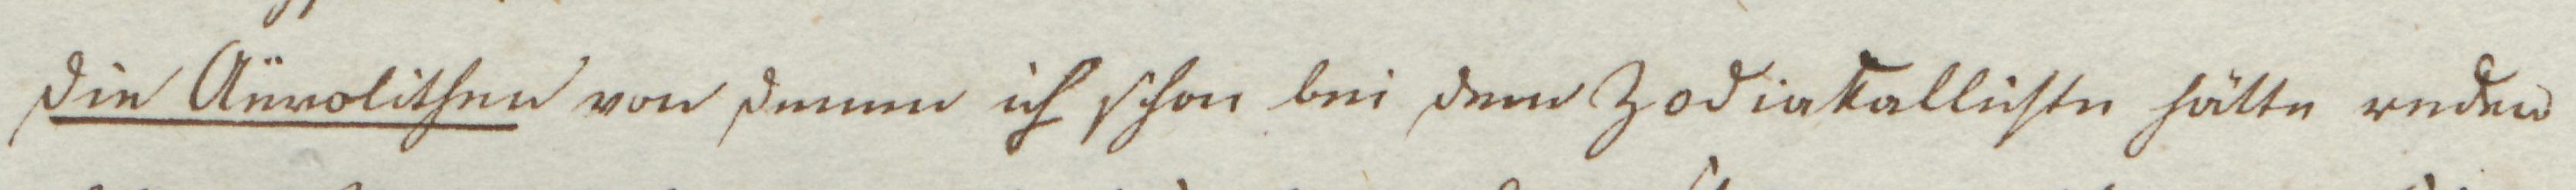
die Aërolithen von denen ich schon bei dem Zodiakallichte hätte reden
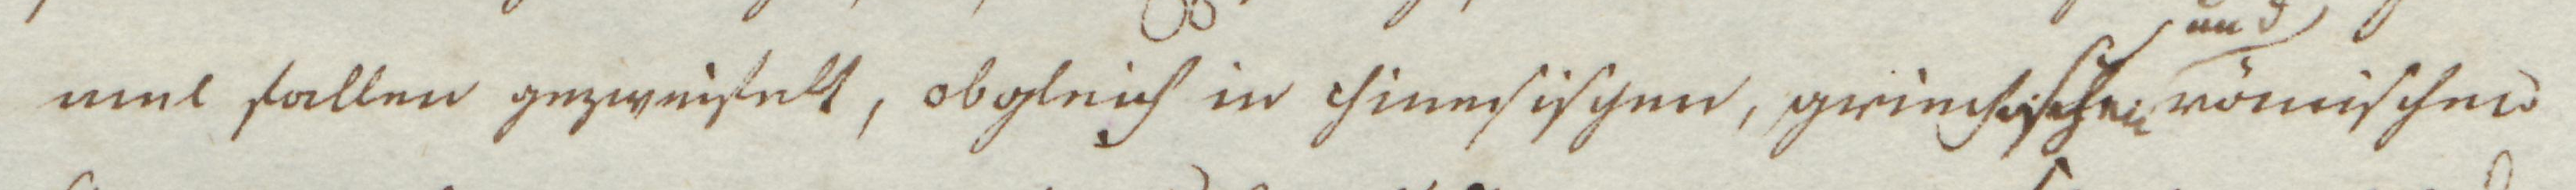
mel fallen gezweifelt, obgleich in chinesischen, griech: u.ischen und römischen
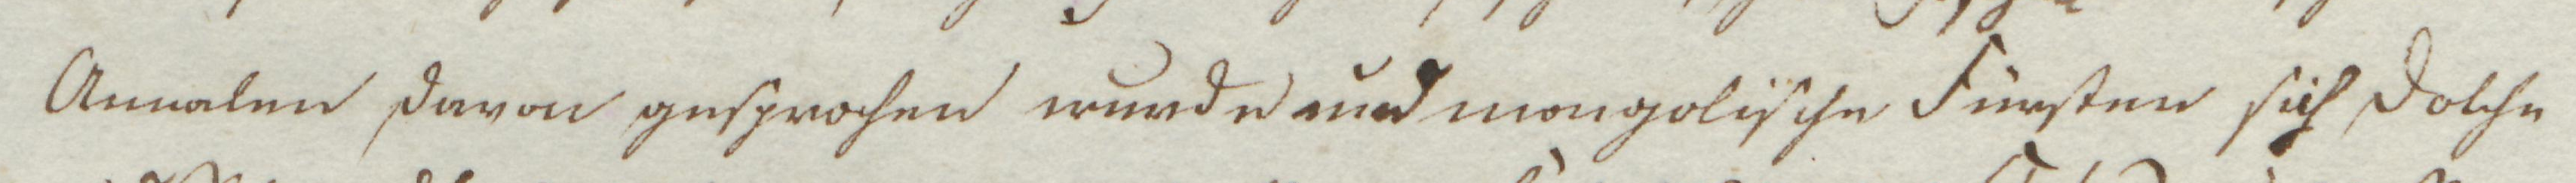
Annalen davon gesprochen wurde u.und mongolische Fürsten sich Dolche
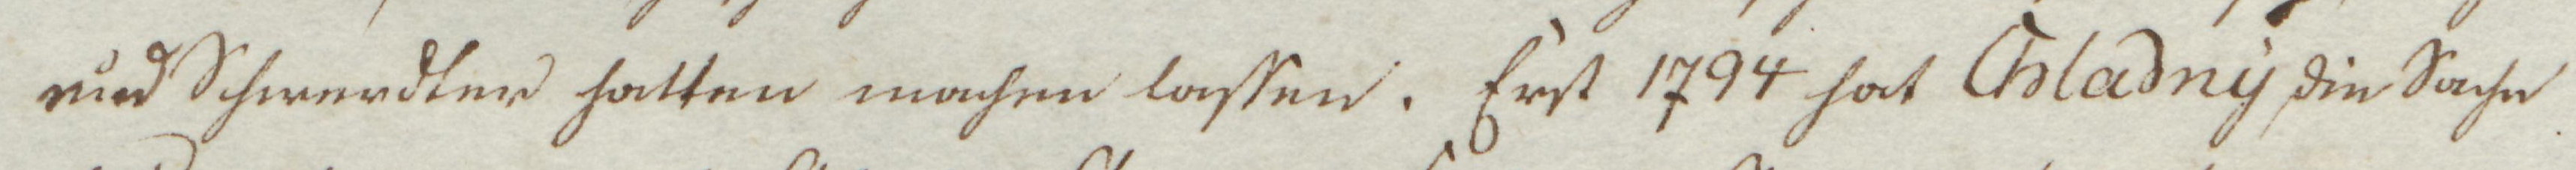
u.und Schwerdter hatten machen lassen. Erst 1794 hat Chladnÿ die Sache
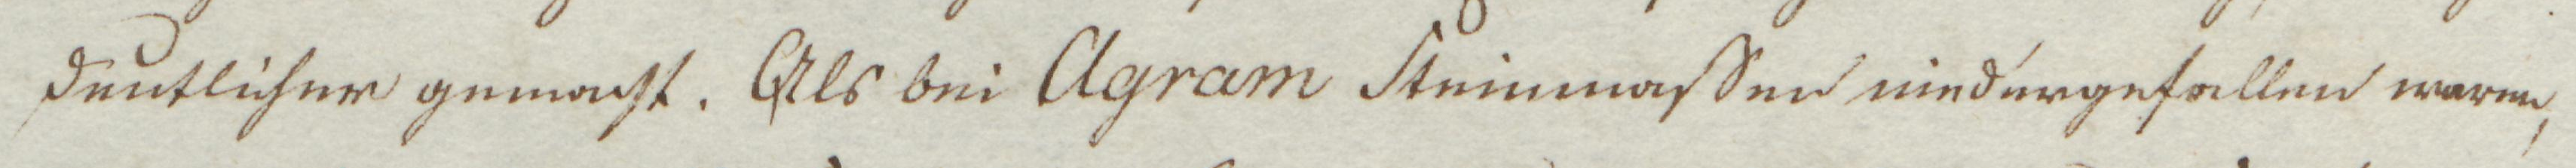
deutlicher gemacht. Als bei Agram Steinmassen niedergefallen waren,
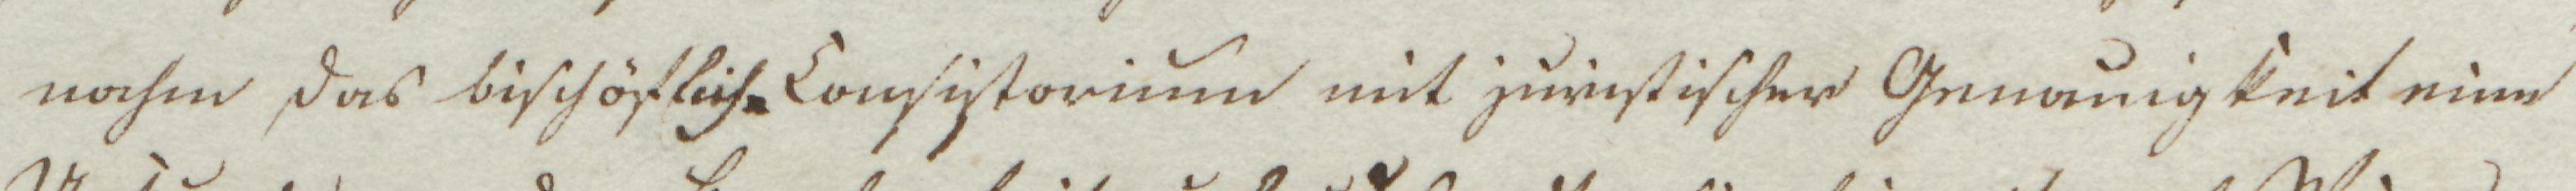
nahm das bischöfl:iche Consistorium mit juristischer Genauigkeit eine
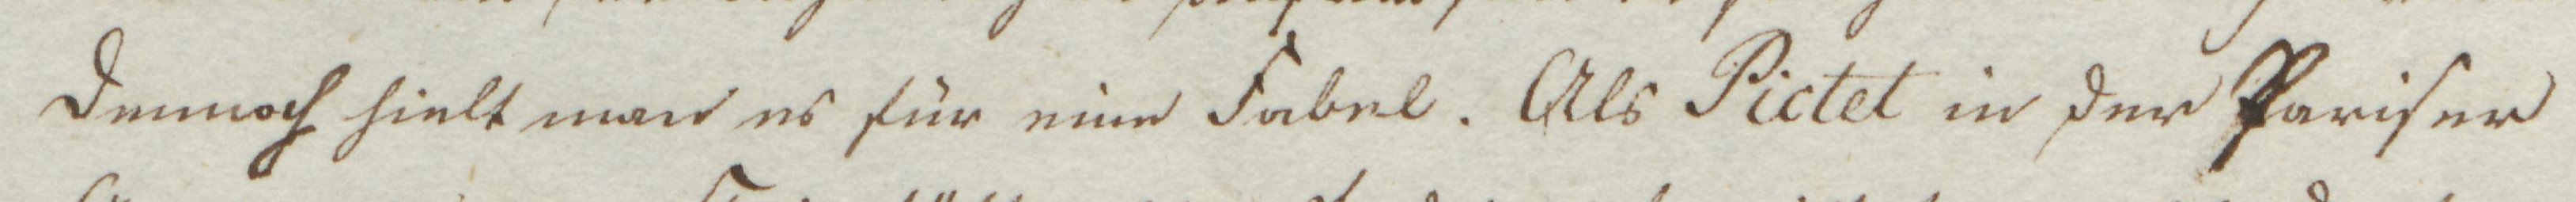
Dennoch hielt man es für eine Fabel. Als Pictet in der Pariser
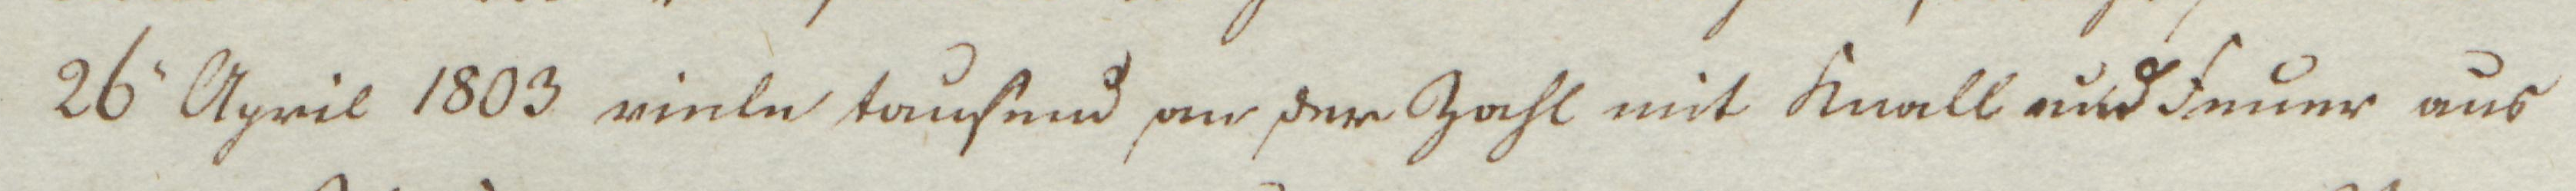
26￼ April 1803 viele tausend an der Zahl mit Knall u.und Feuer aus
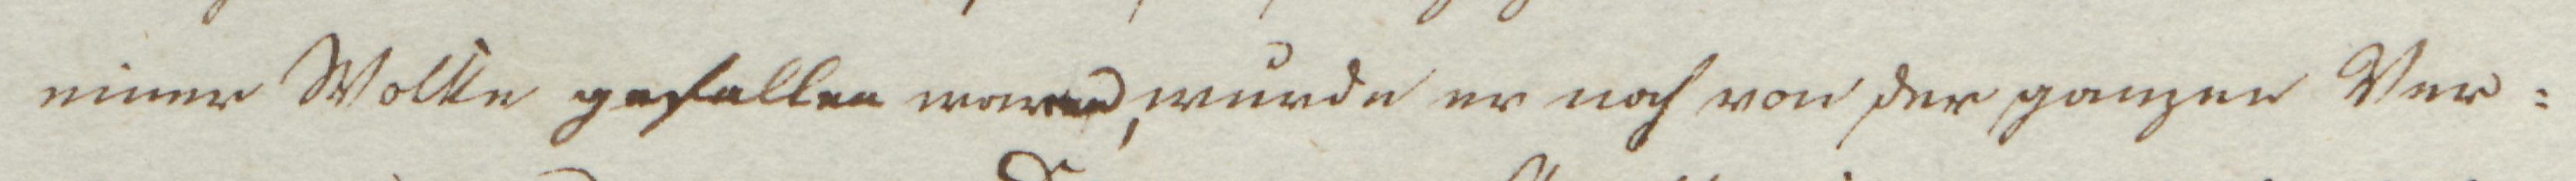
einer Wolke gefallen war,en, wurde er noch von der ganzen Ver-
